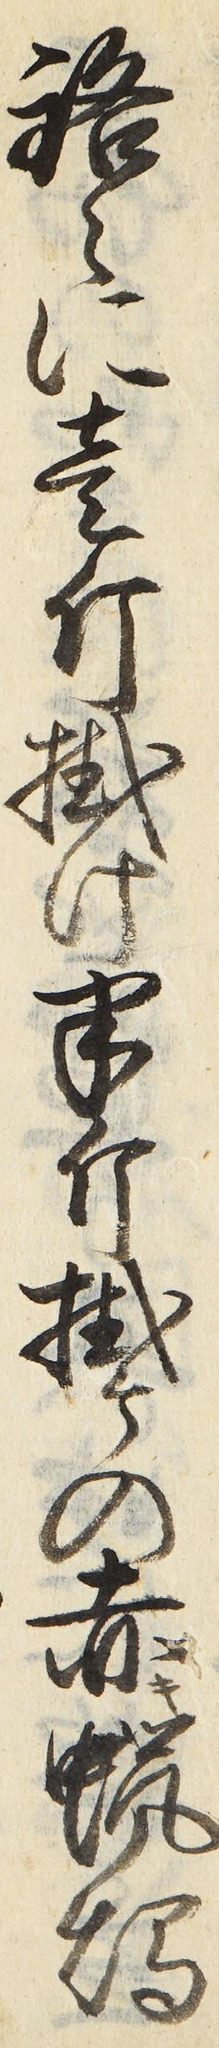銘々に壱斤掛け半斤掛けの赤き蝋燭
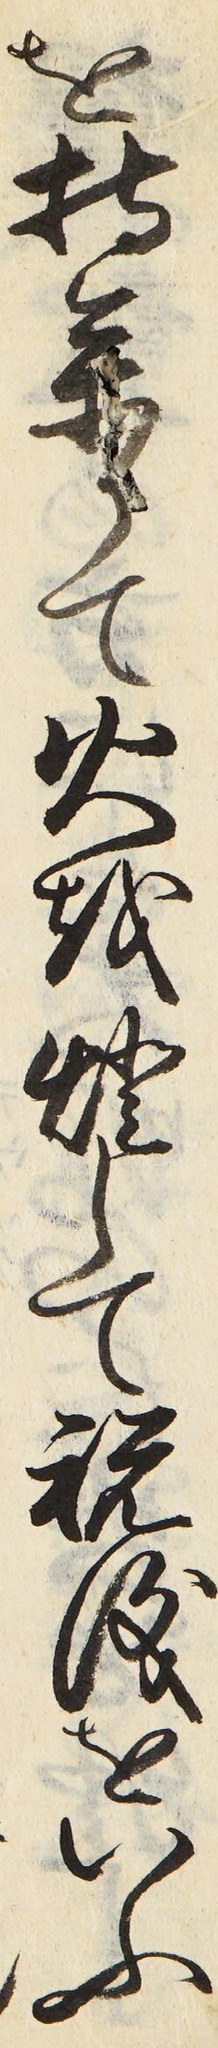を持参して火を燈して祝儀をいふ
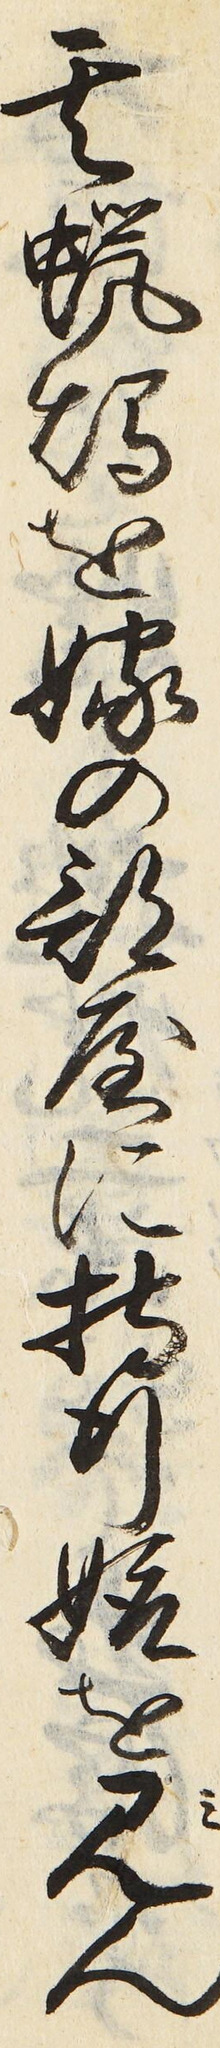其蝋燭を嫁の部屋に持行娵を見ん
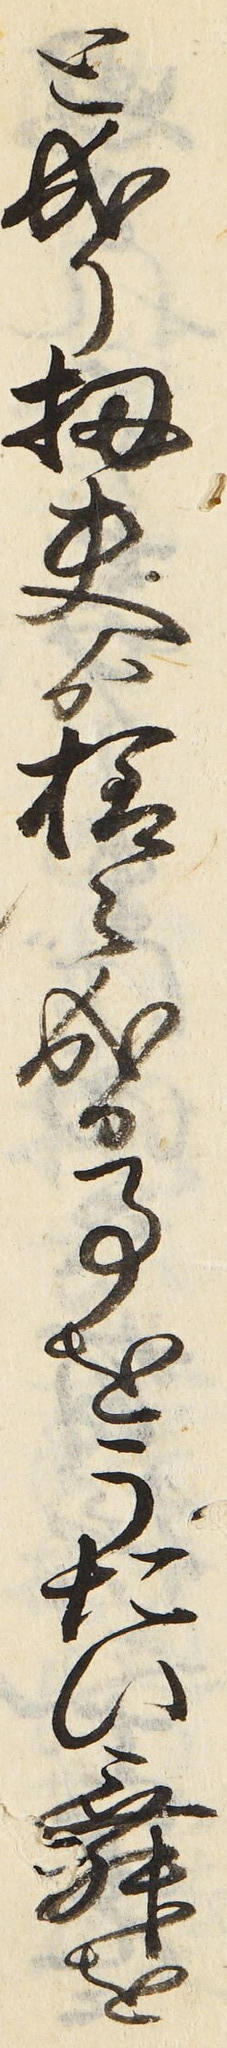と成り扨夫ゟ様々成る事をうたひ舞を
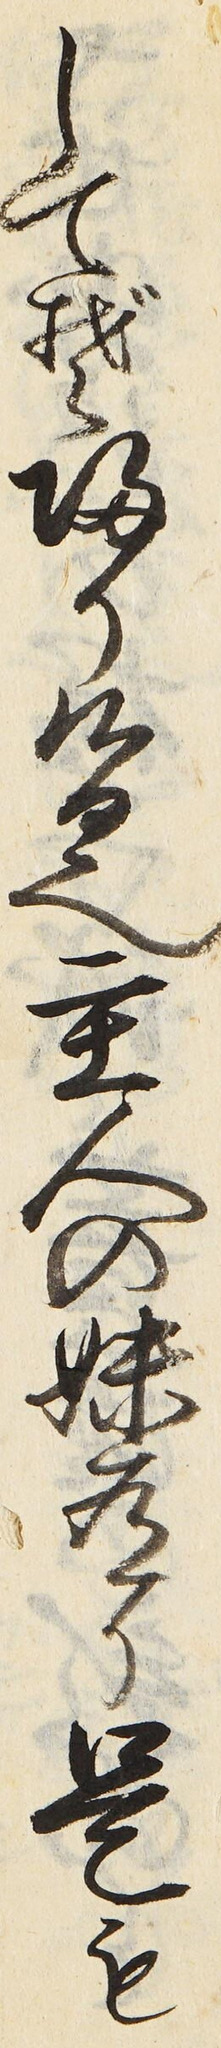してぞ帰りける也主人の妹有り是も
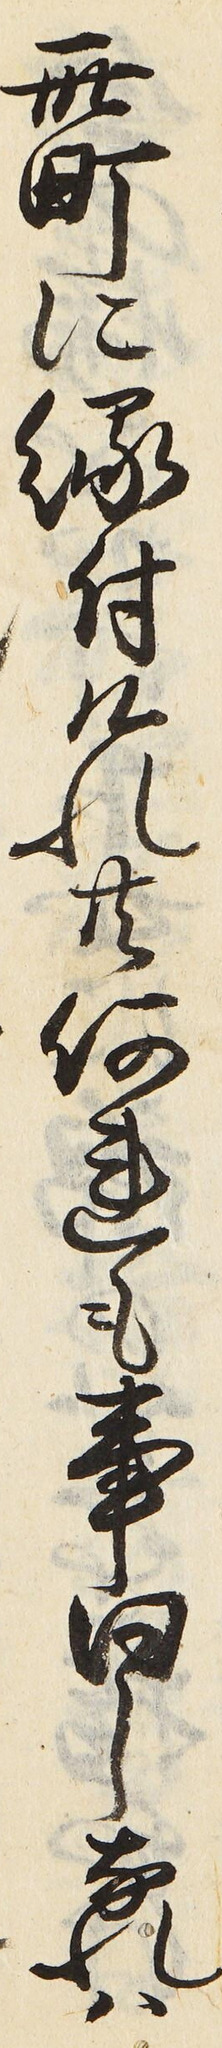此町に縁付けれ共何れも事同しなれは
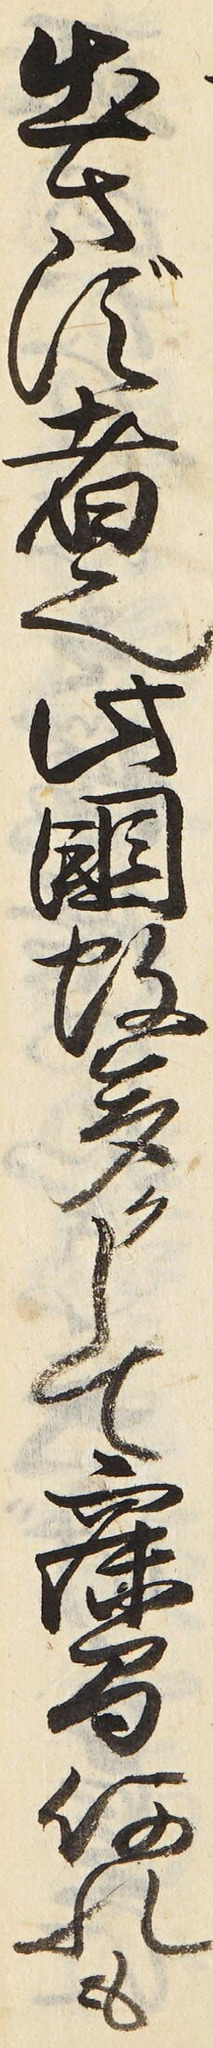出さず者也此国蚊多くして寝間何れも
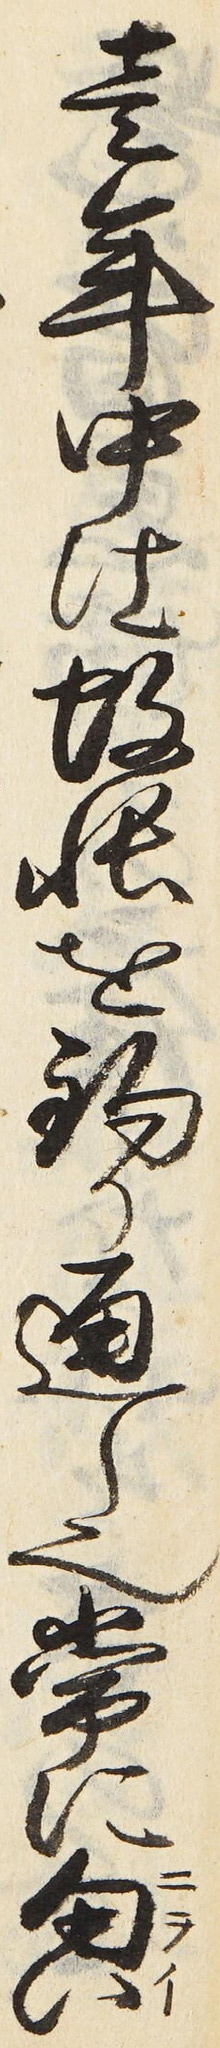壱年中は蚊帳を釣り通し也常に匂ひ
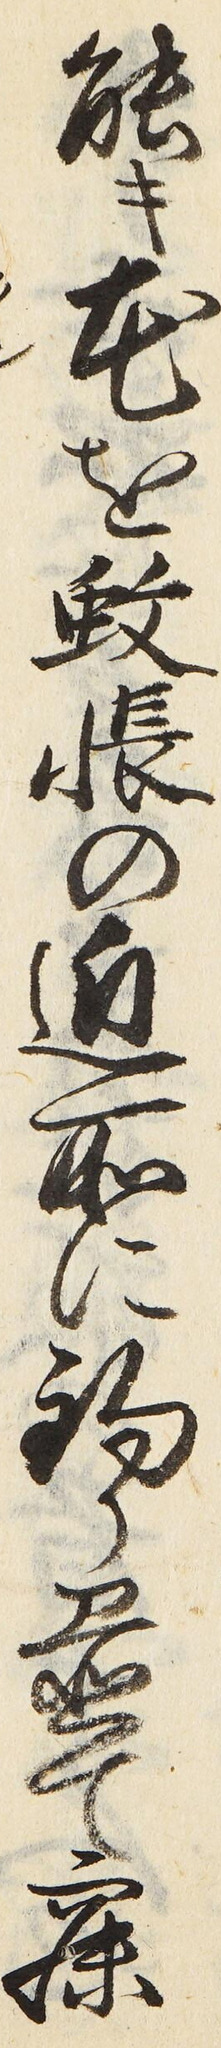能き花を蚊帳の近所に釣り置て寝
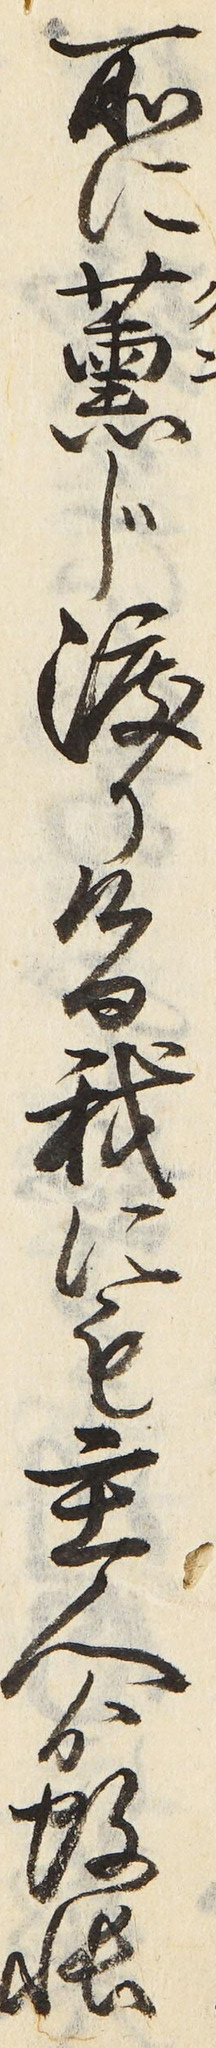所に薫じ渡りける我にも主人ゟ蚊帳
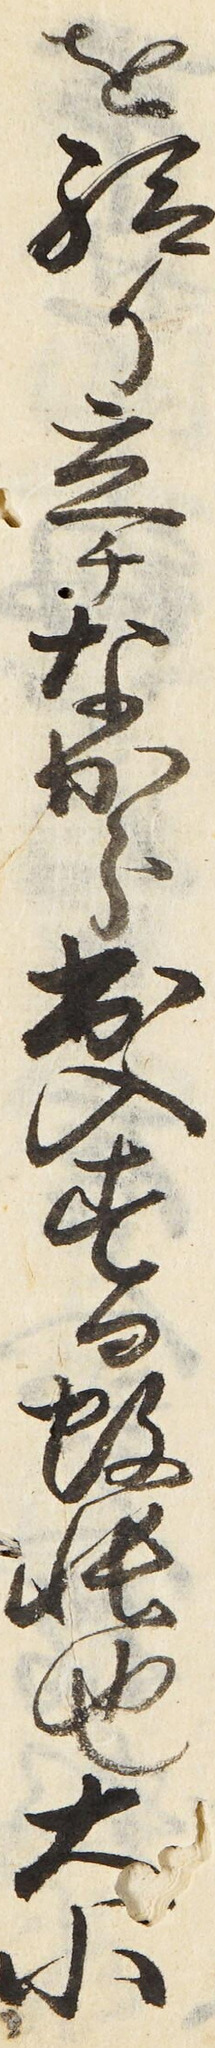を給り立ちなから出入する蚊帳也大小
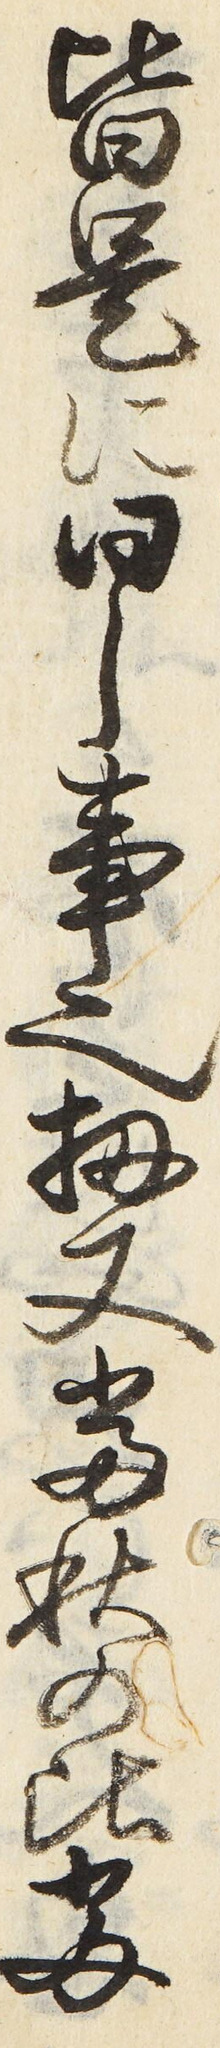皆是に同し事也扨又当秋の頃当
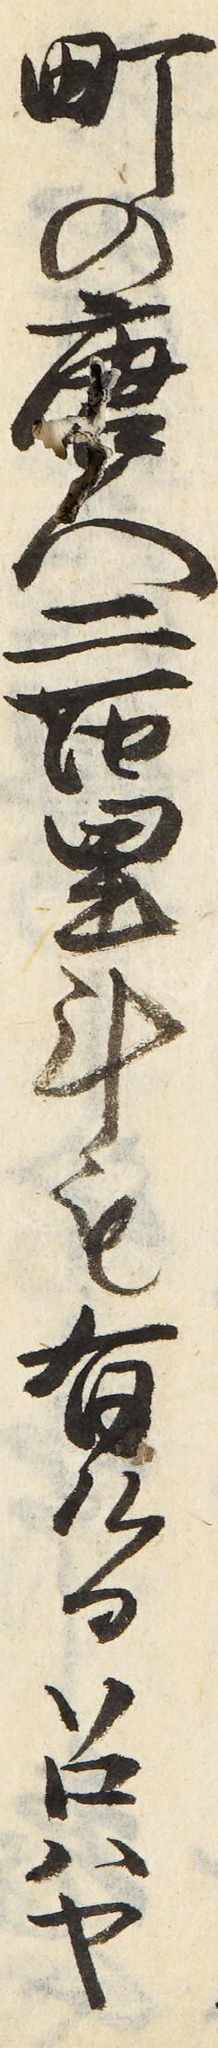町の唐人二百里計も有けるソロハヤ
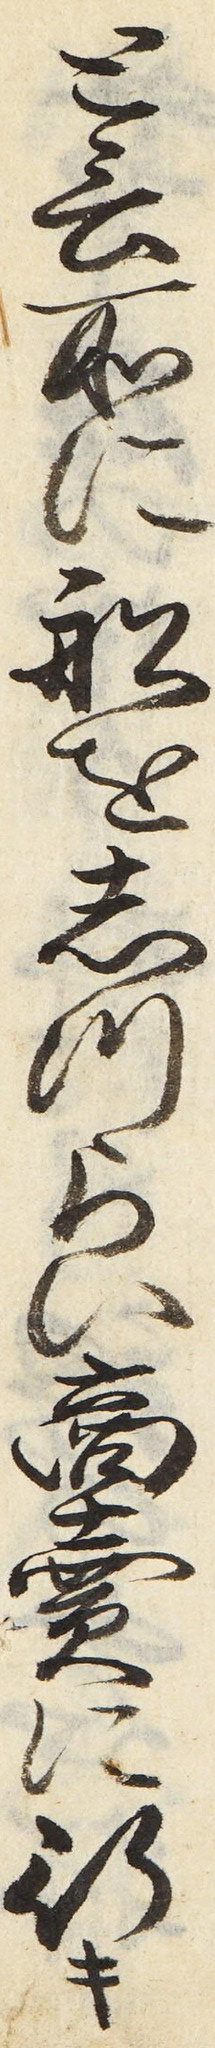と云所に船をしつらい商売に行き
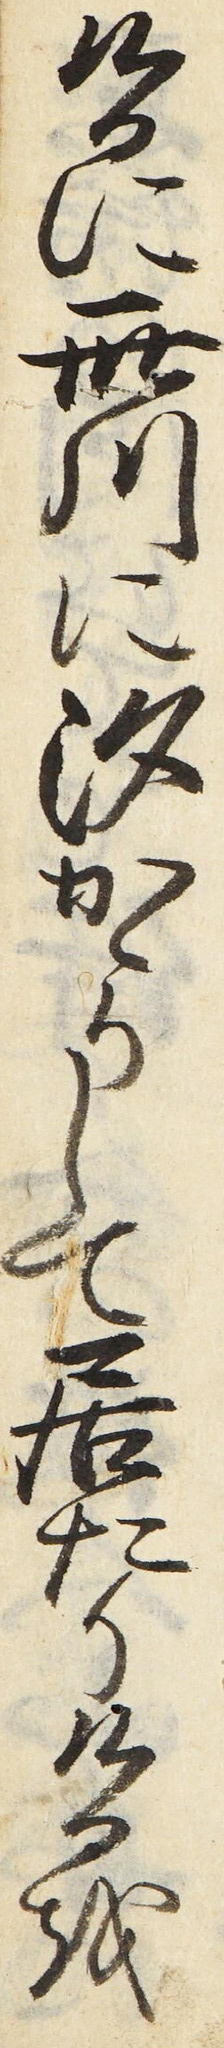けるに此川に汐かゝりして居たりけるを

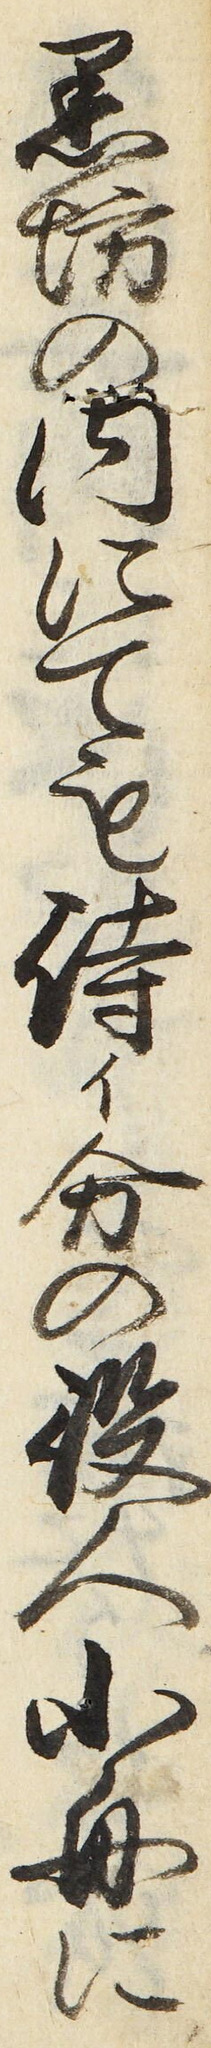黒坊の内にても侍い分の役人小舟に
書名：華夷九年録
